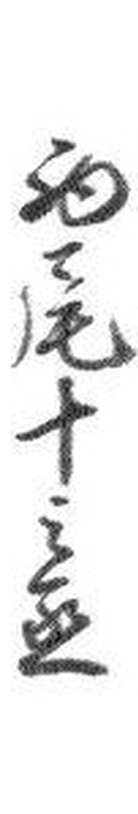西尾十之丞
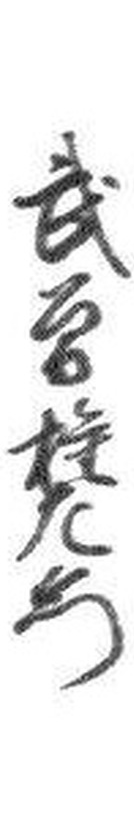武曽権左衛門
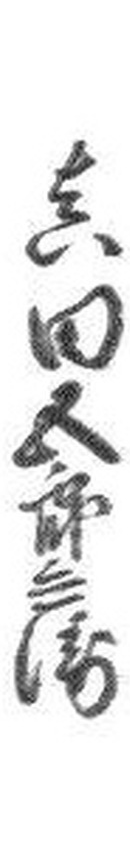真田五郎兵衛
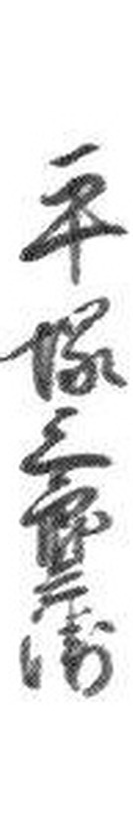平塚三郎兵衛
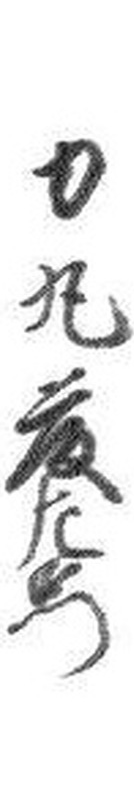力丸藤左衛門
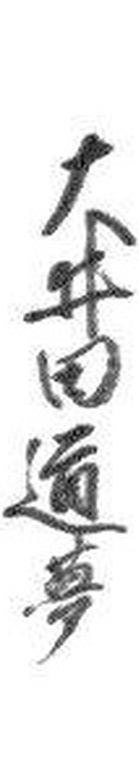大井田道夢
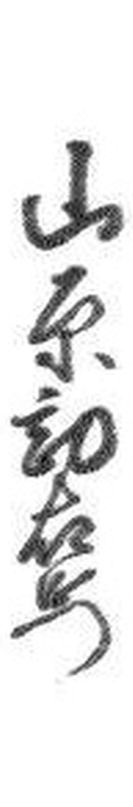山原勘右衛門
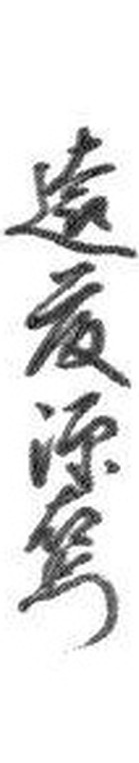遠藤源右衛門

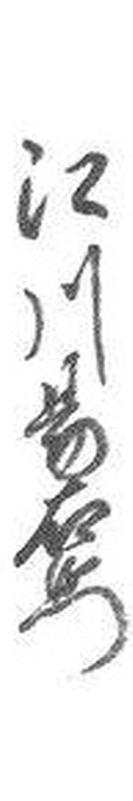江川易右衛門
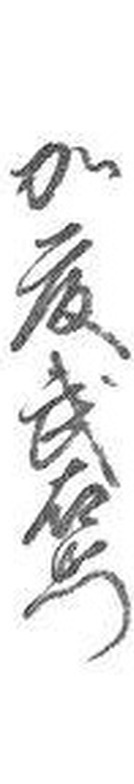加藤武右衛門
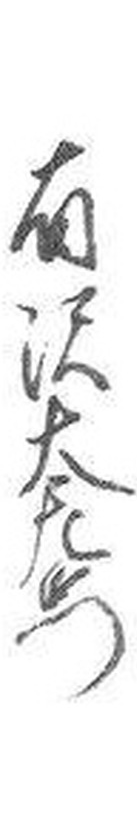有沢太左衛門
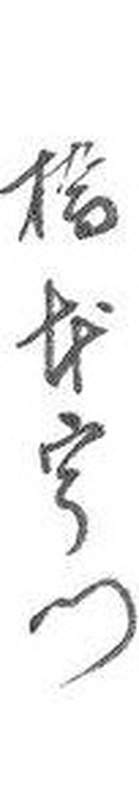橋本宇門
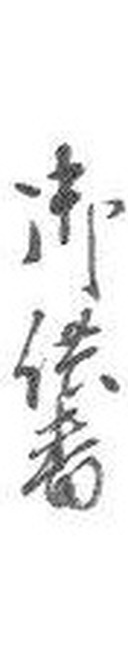御供番
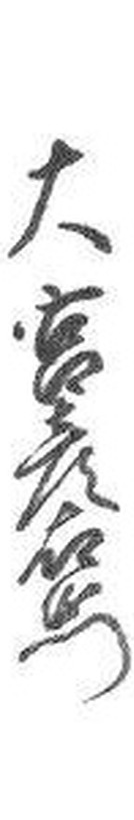大宮彦右衛門
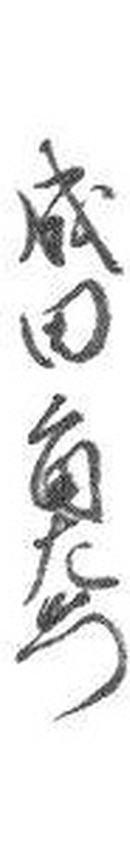成田角左衛門
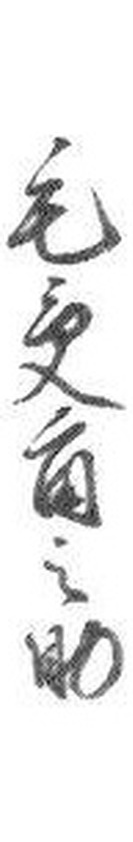毛受角之助
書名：家譜 四 忠昌公 従寛永七年到正保四年
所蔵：福井県文書館 Fukui Prefectural Archives
